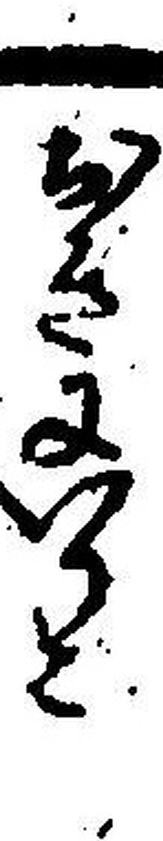おきにいりと
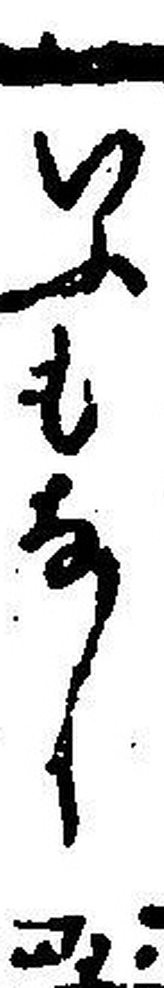いふもなし
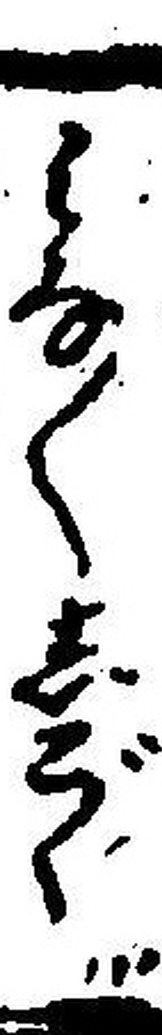みな〳〵しごく
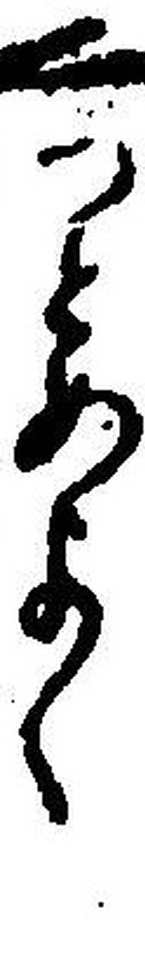つとめよく
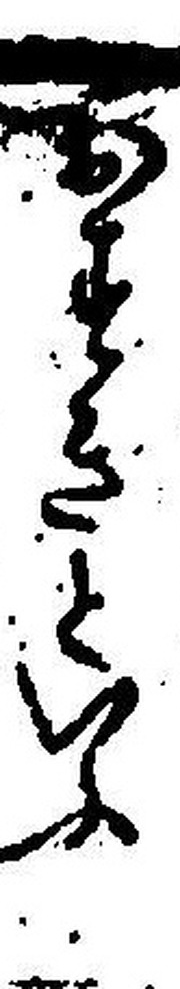おすきといふ
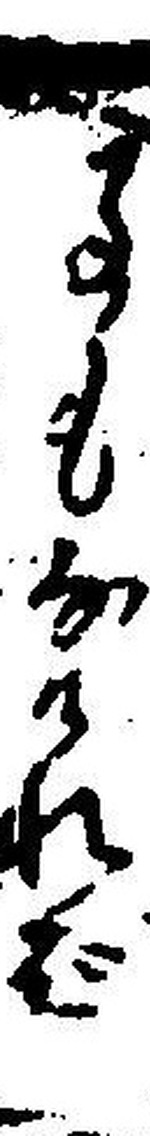事もなければ
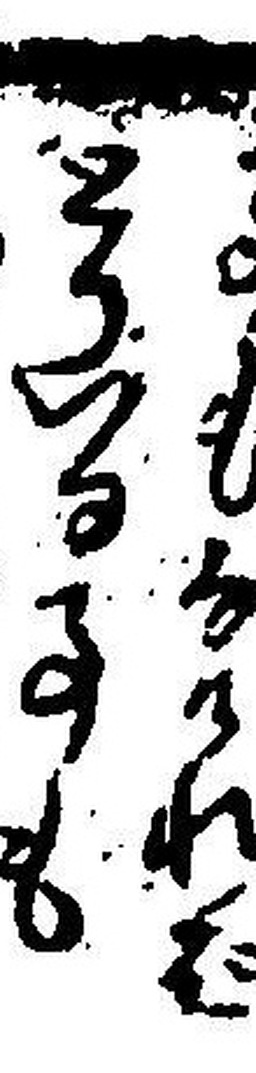とりいる事も
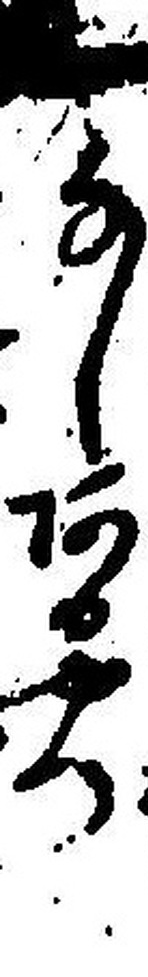なしあるやつ
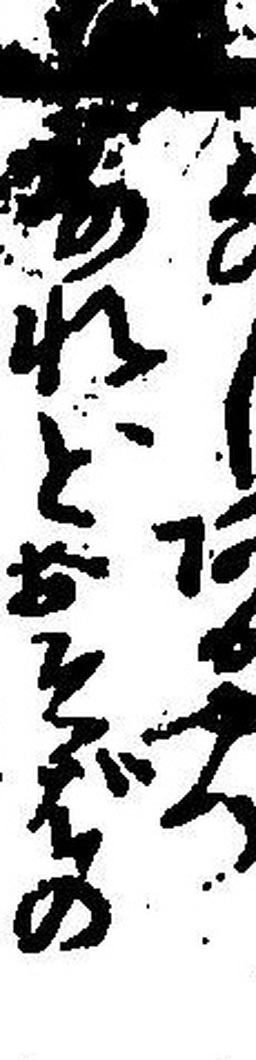なれどおそばの
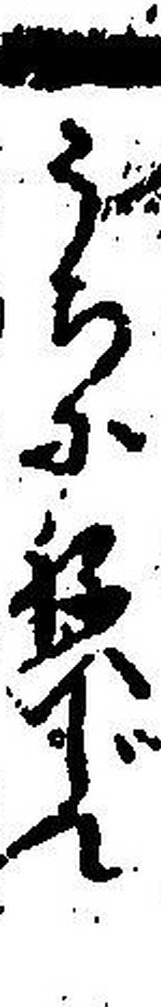うちにねいじん
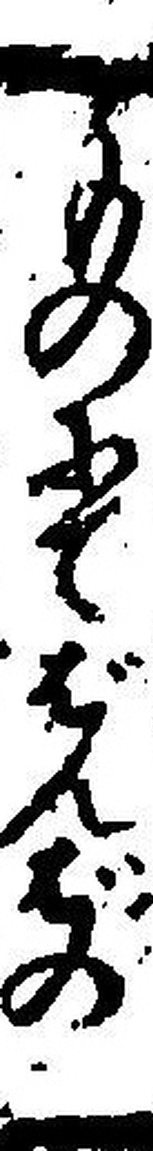ものにてばんばの
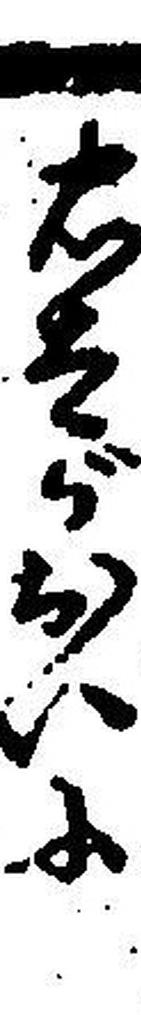忠太がおいに
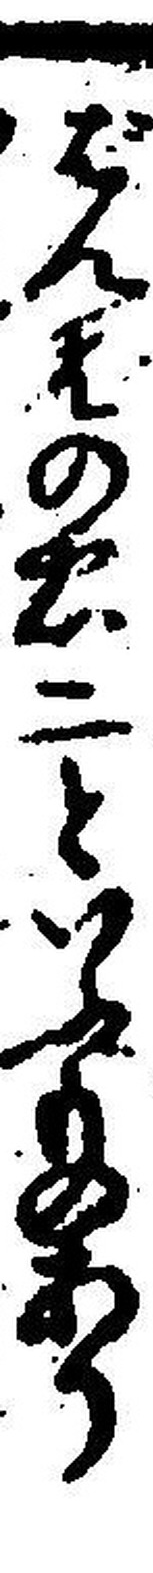ばんばの忠二といふものあり
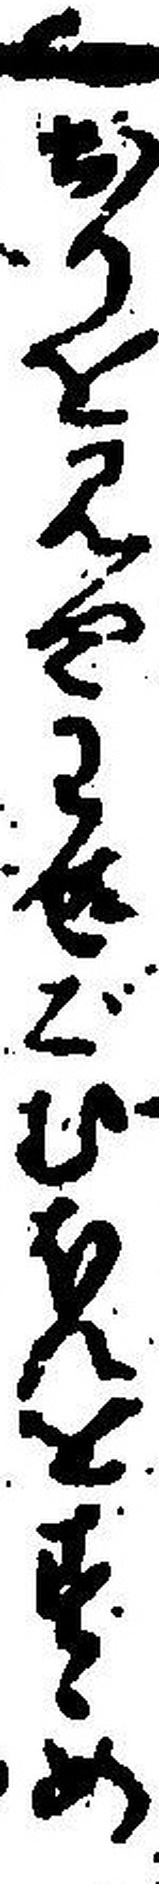おりを見やわせごむほんをすゝめ
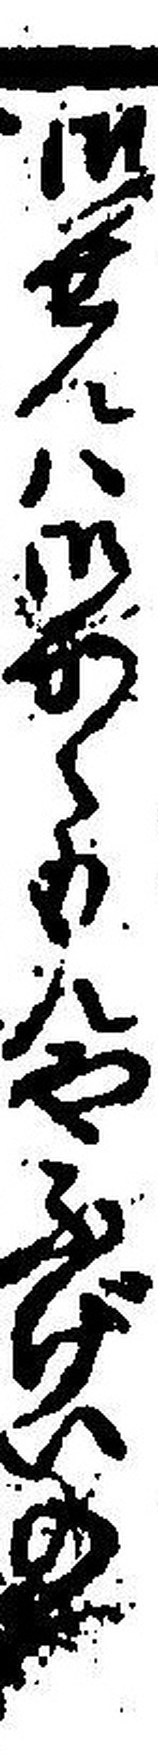御せんは御かくもんやふげいの
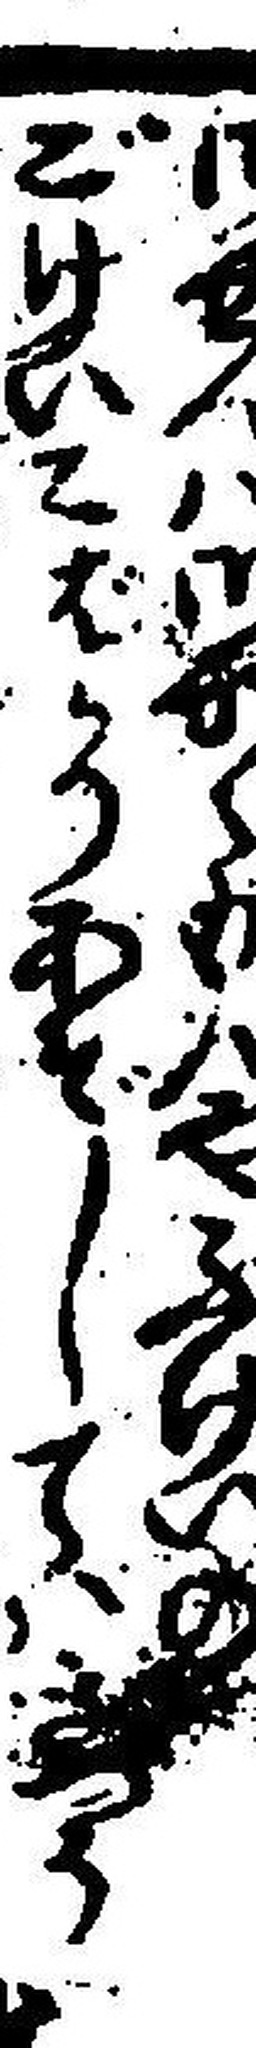ごけいこばかりあそばしてはきつう
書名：御代参牛時詣 / 市場通笑作
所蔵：東京大学総合図書館 General Library in the University of Tokyo, JAPAN
